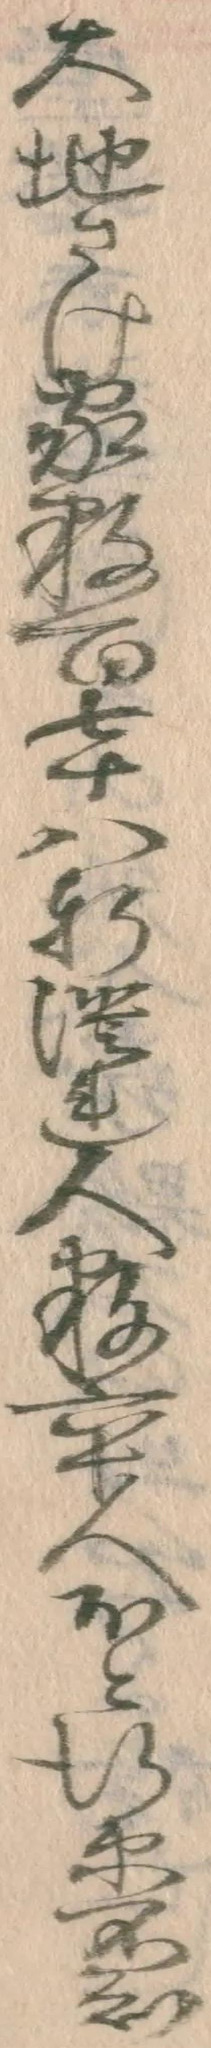大地さけ家数百七十八軒潰れ人数六十人ほと行衛不知
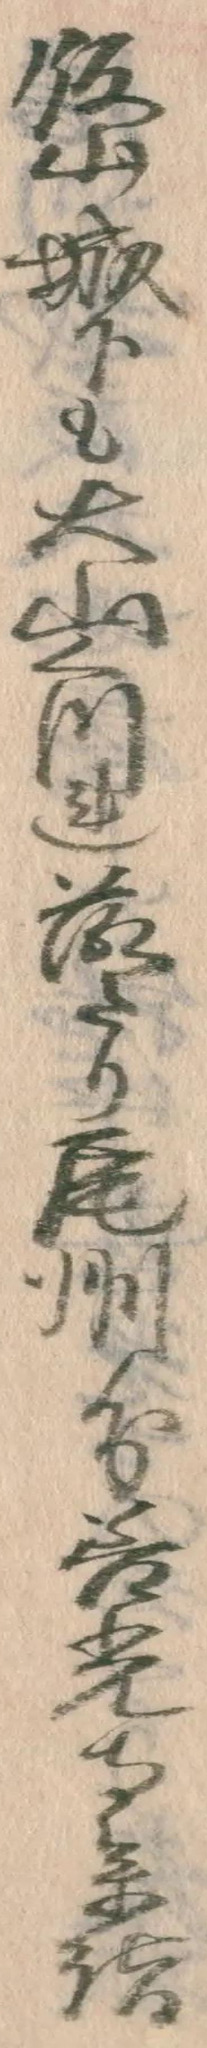飯山城下も大山くつれ落たり尾州より善光寺参詣
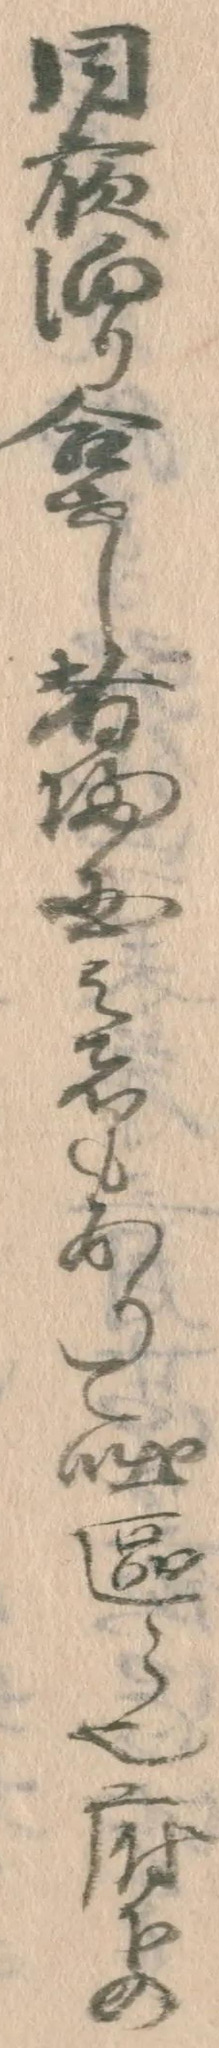同夜泊り合せし者帰国之者もありて咄區々也府もの
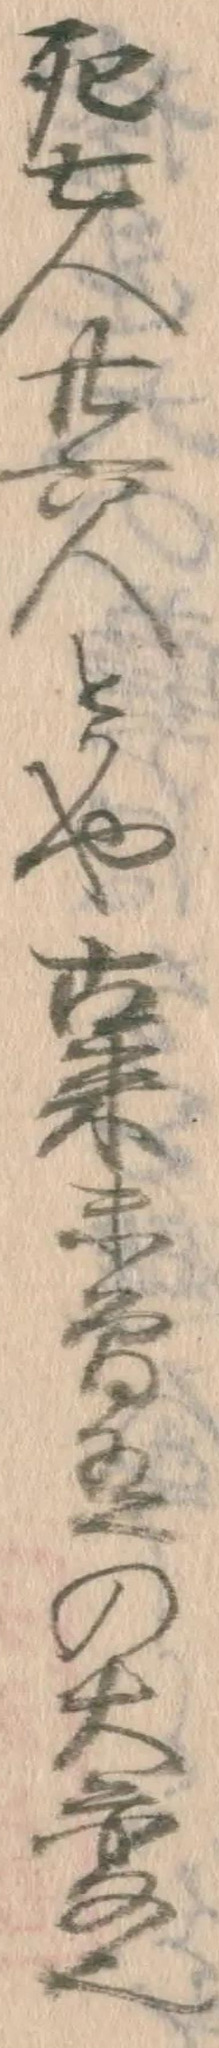死亡人廿六人とかや古来未曽有の大変也
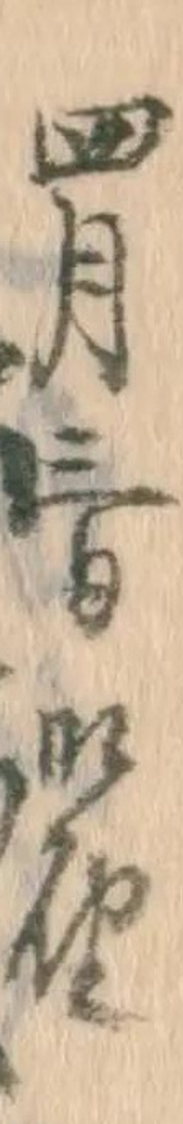四月三日御届
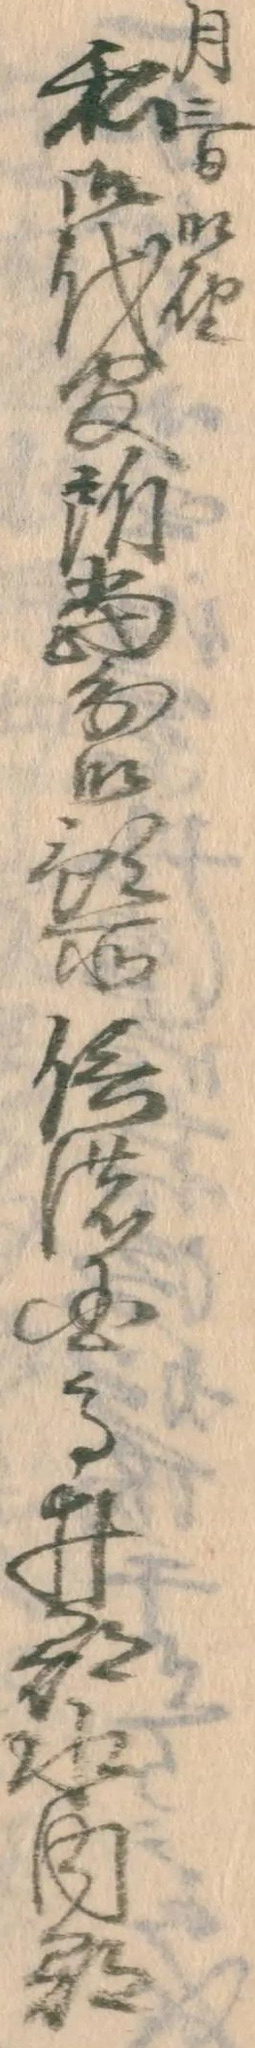私御代官所当分御預所信濃国高井郡水内郡
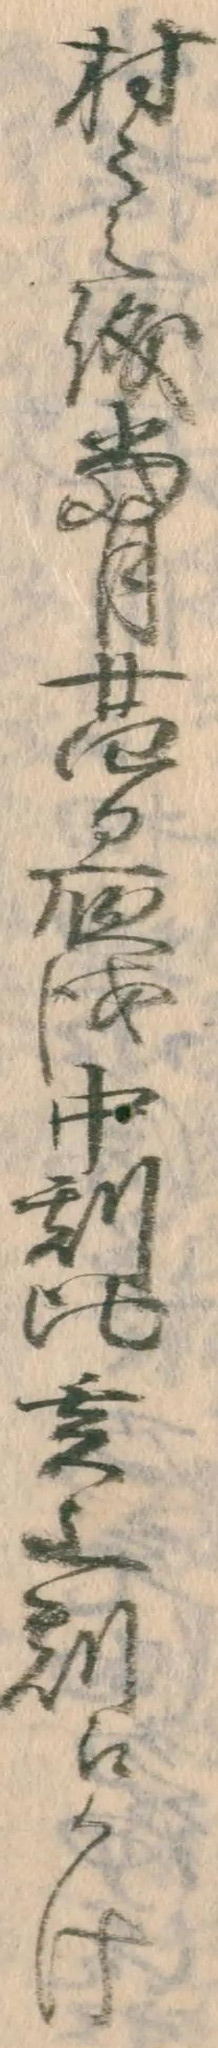村々之儀当月廿四日夜戌中刻比亥上刻頃江かけ
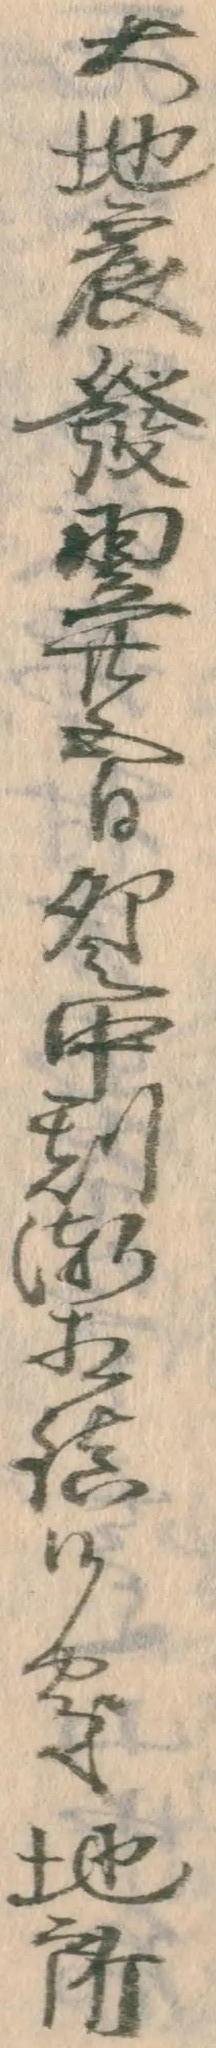大地震発翌廿五日卯之中刻漸相鎮候処地所
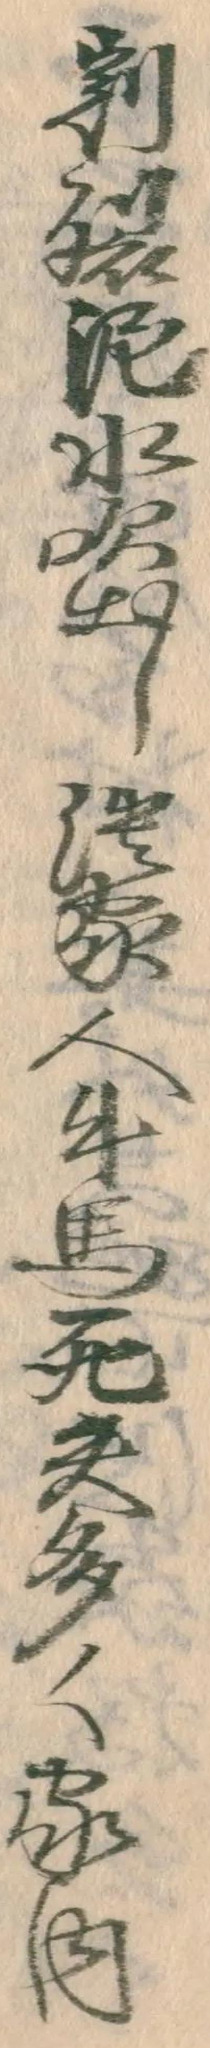割裂泥水吹出し潰家人牛馬死失多く家内
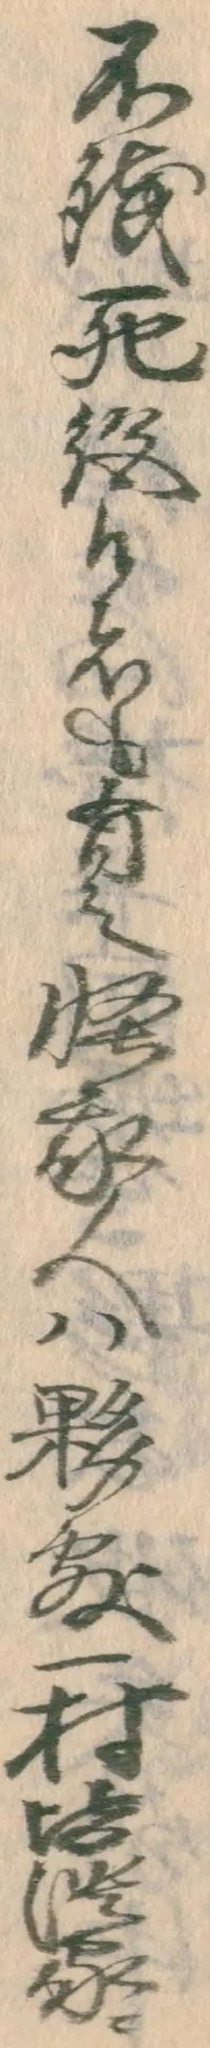不残死絶候者も有之怪我人ハ夥敷一村皆潰家ニ
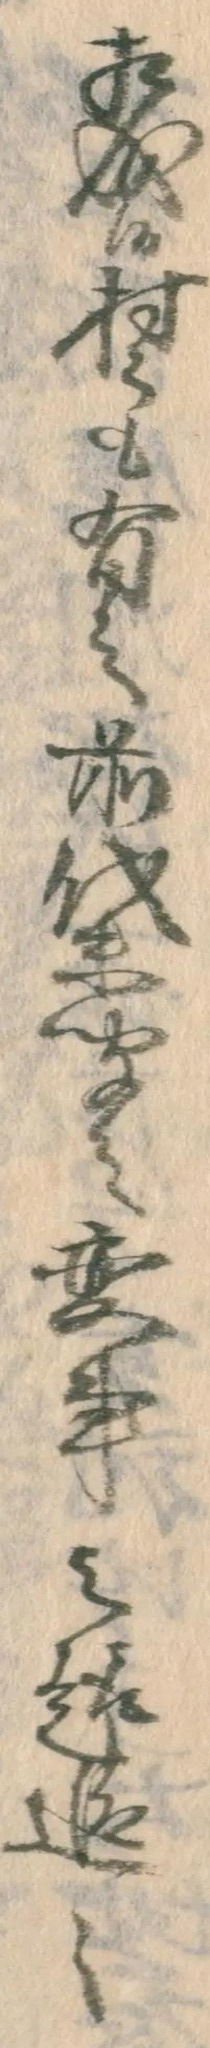相成候村々も有之前代未聞之変事之趣追々
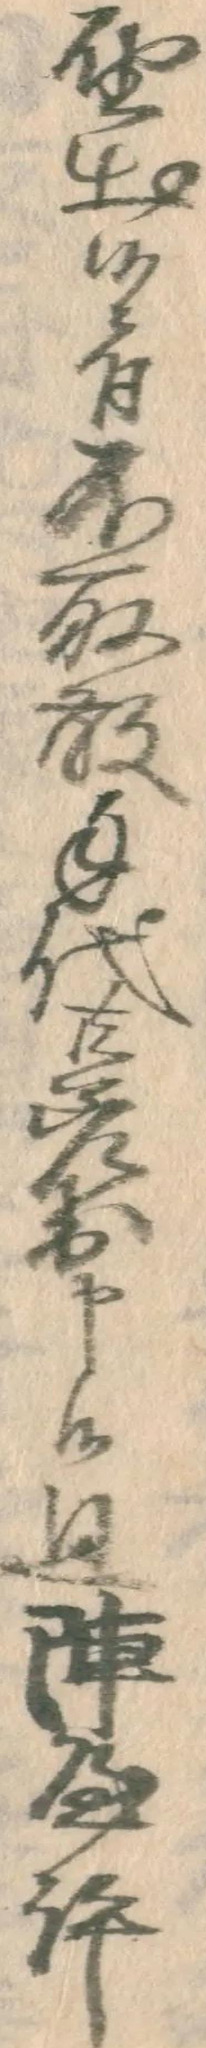届出候ニ付不取敢手代共差出申候且陣屋許
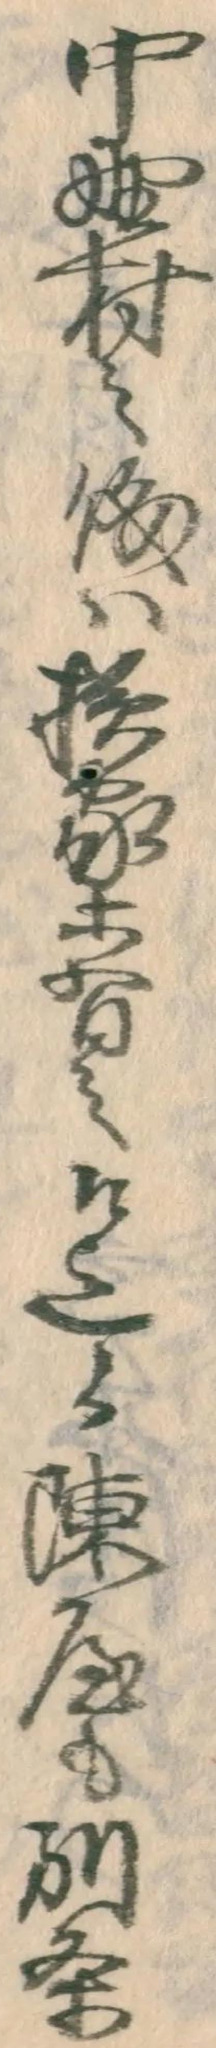中野村之儀ハ損家等有之候迄ニ而陣屋も別条
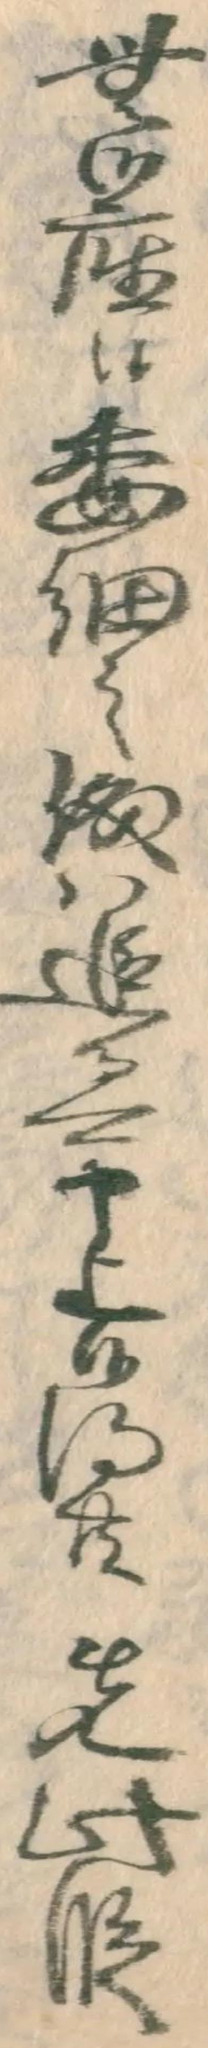無御座候委細之儀ハ追而可申上候得共先此段

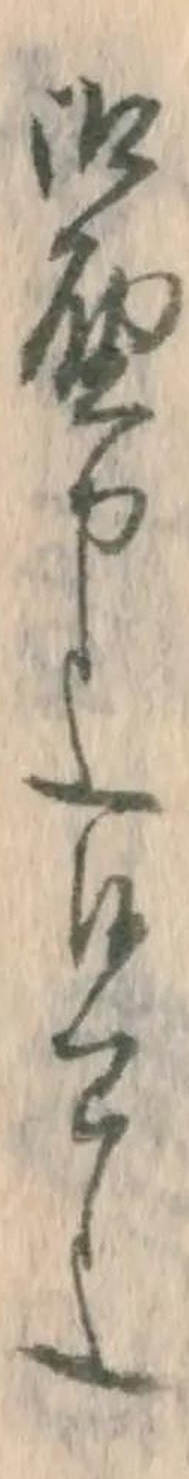御届申上候已上
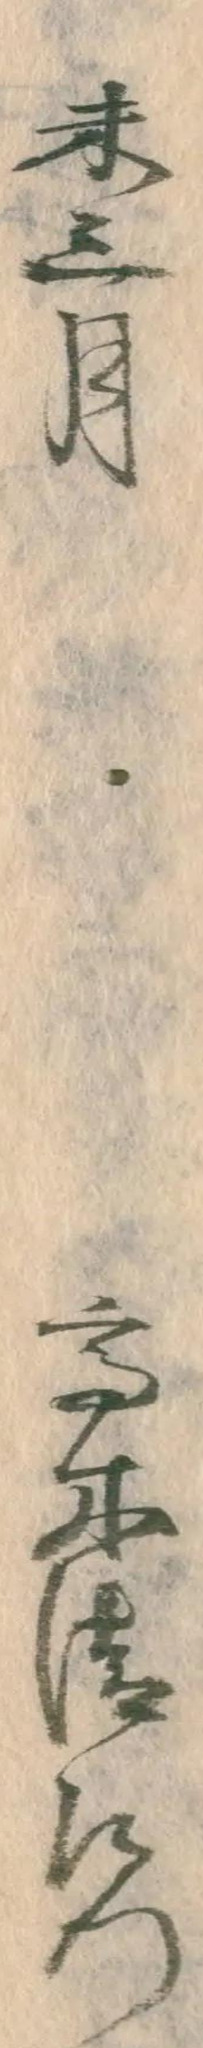未三月高木清左衛門
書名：信州大地震之記
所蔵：国立国会図書館 National Diet Library, JAPAN
